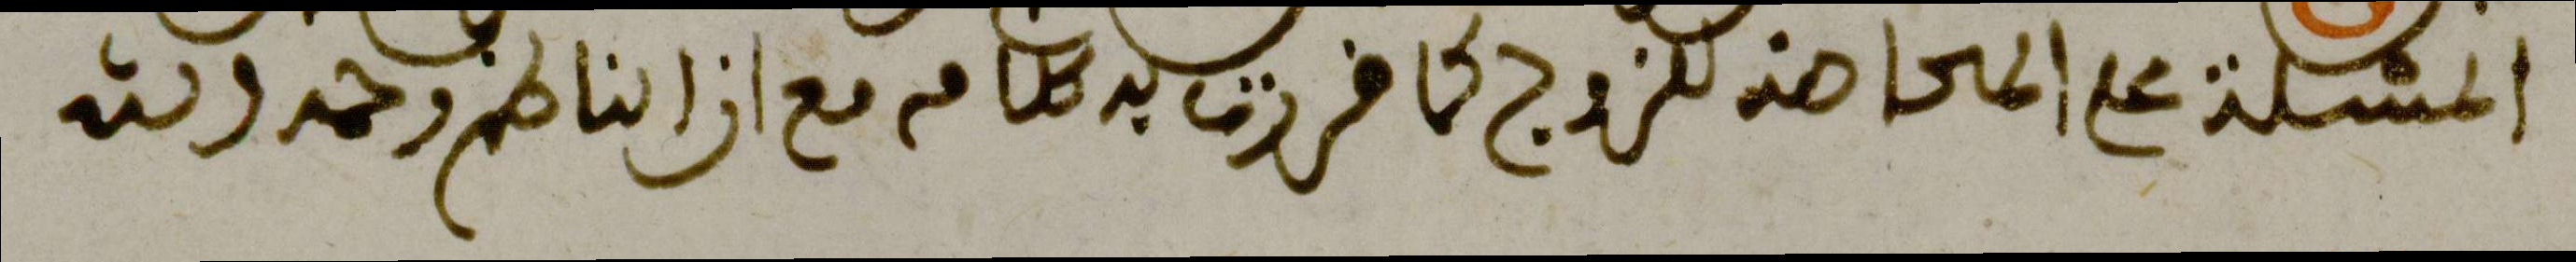المسئلة على المحاصة للزوج كما قررت به كلامه مع ان الناظم رحمه الله
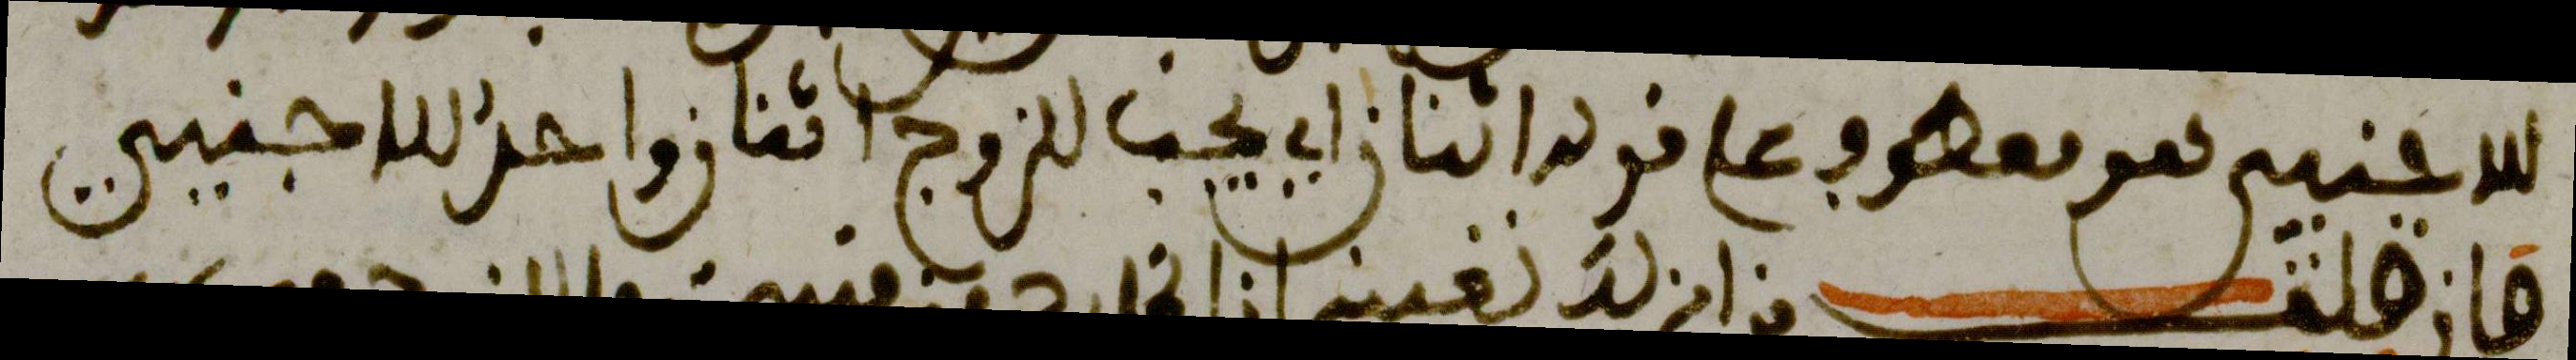للاجنبي هو معطوف على قوله اثنان اي يجب للزوج اثنان واحد للاجنبي
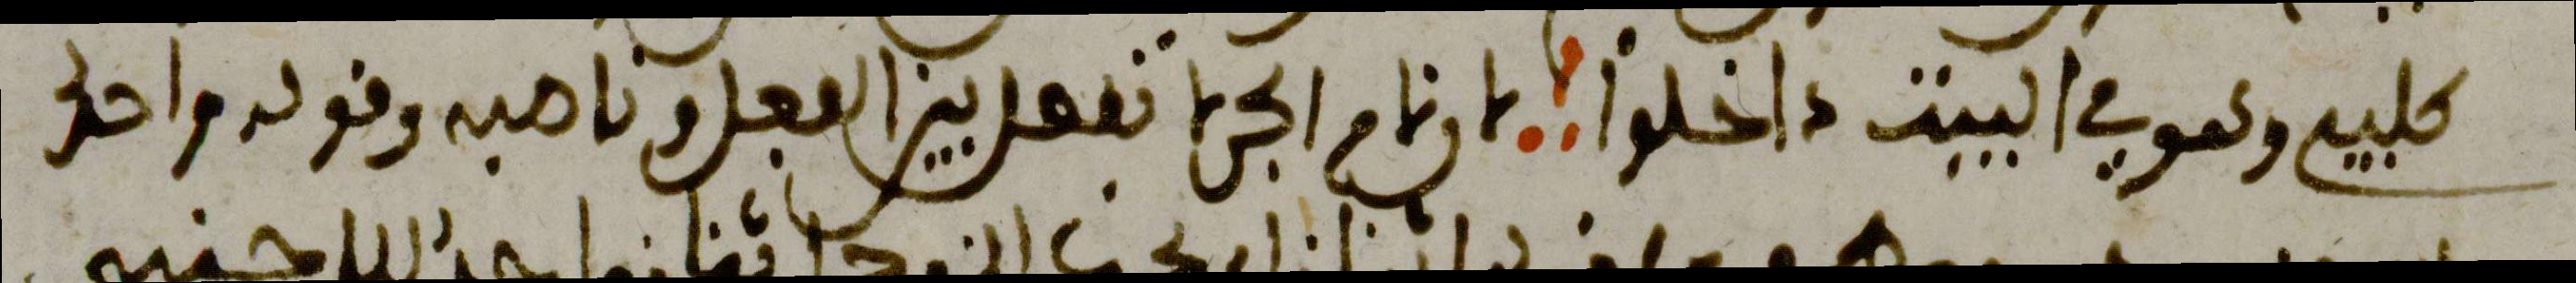كلبي وهو في البيت داخلوا لان لام الجر لا تفصل بين الفعل وناصبه وقوله واحد
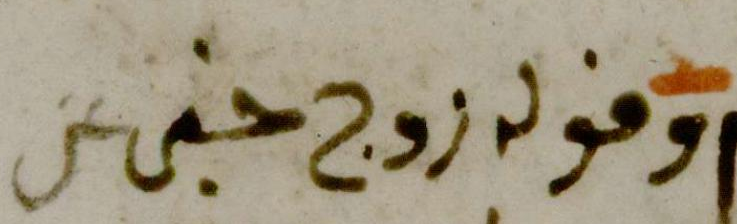وَقوله زوج خبرعن
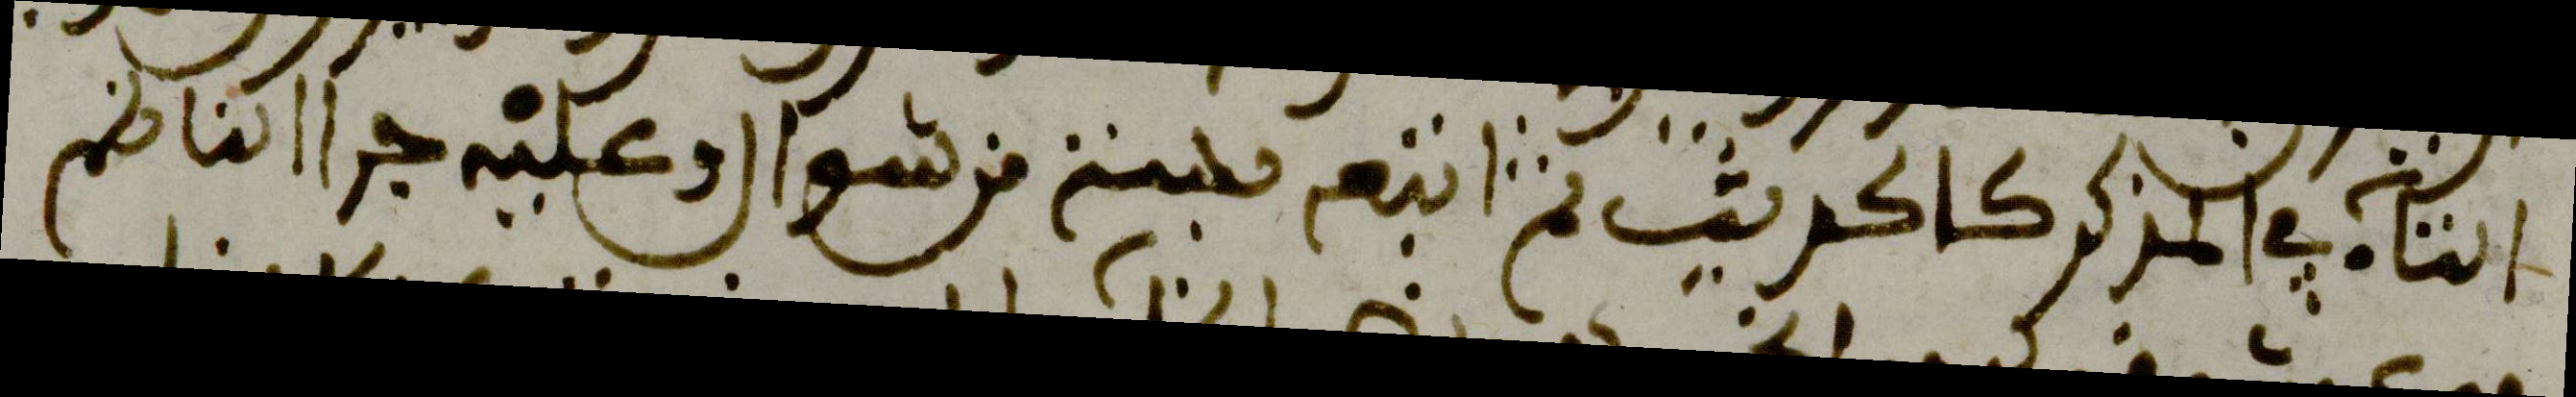التاء في المذكر كالحديث ثم اتبعه بست من شوال وعليْه جرا الناظم
